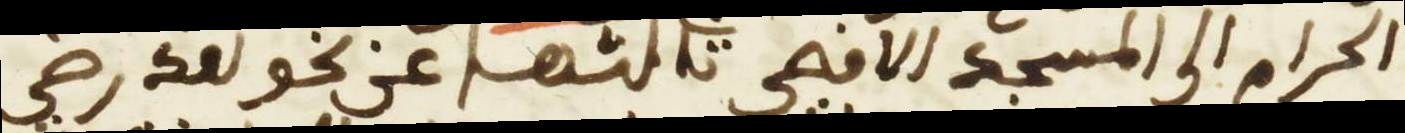الحرام الى المسجد الاقصى ثالثها عن نحو لقد رضي
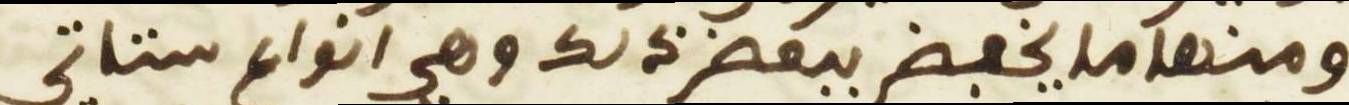ومنها ما يخفض ببعض ذلك وهي انواع ستاتي
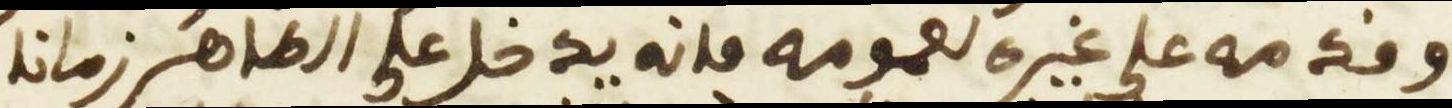وقدمه على غيره لعمومه فانه يدخل على الظاهر زمانا
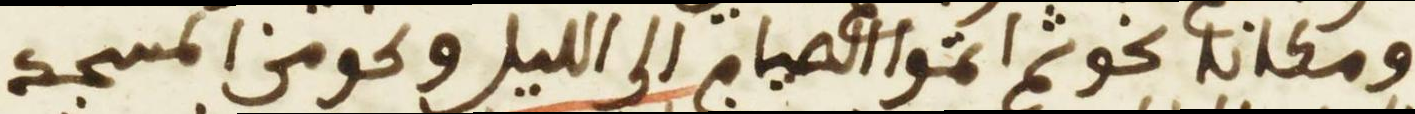ومكانا نحو ثم اتموا الصيام الى الليل ونحو من المسجد
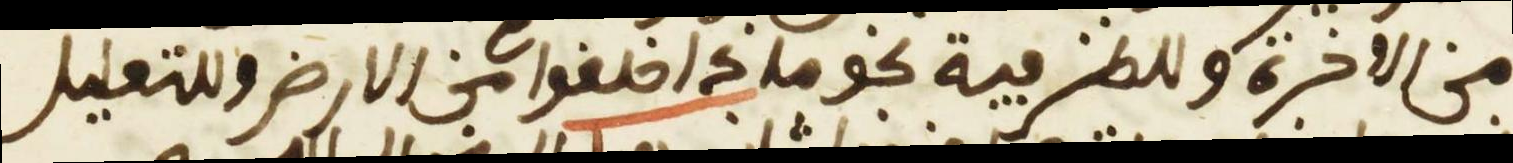من الاخرة وللظرفية نحو ماذا خلقوا من الارض وللتعلبل
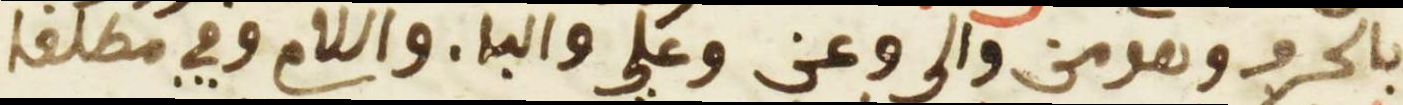بالحرف وهو من والى وعن وعلي والباء واللام وفي مطلقا
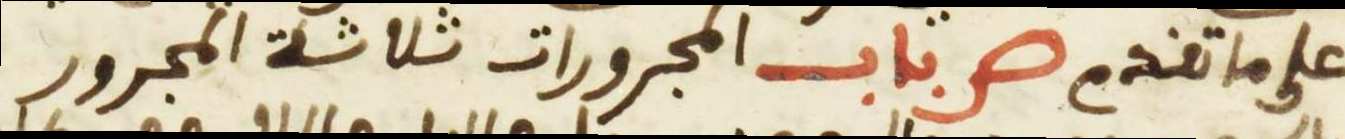على ما تقدم ص باب المجرورات ثلاثة المجرور
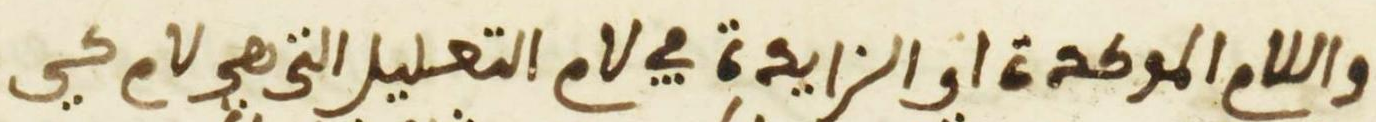واللام الموكدة أي الزايدة في لام التعليل التي هي لام كي
